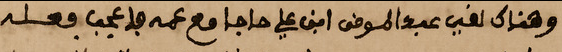وهناك لقي عبد المومن ابن علي حاجا مع عمه فاعجب فعله
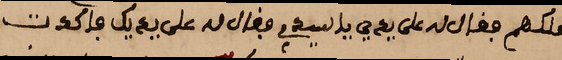ملكهم فقال له على يدي يا سيدي فقال له على يديك فاكدت
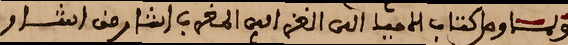ولما وصل كتاب الاحيا الى الغزالي المغرب اشار من اشار
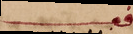قف
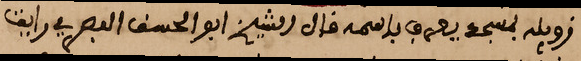زويلة بمسجد يعرف باسمه قال الشيخ ابو الحسن البصري رايت
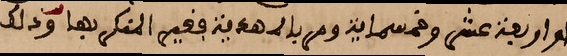او اربعة عشر وخمسماية ومر بالمهدية فغير المنكر بها وذلك
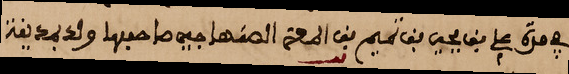في مدة علي بن يحيى بن تميم بن المعز الصنهاجي صاحبها ولد بمدينة
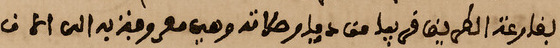بقارعة الطريق قريبا من ديار صلاته وهي معروفة به الى الان
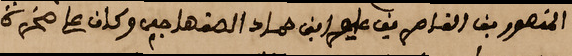المنصور بن الناصر بن عامر ابن حماد الصنهاجي وكان على صخرة
